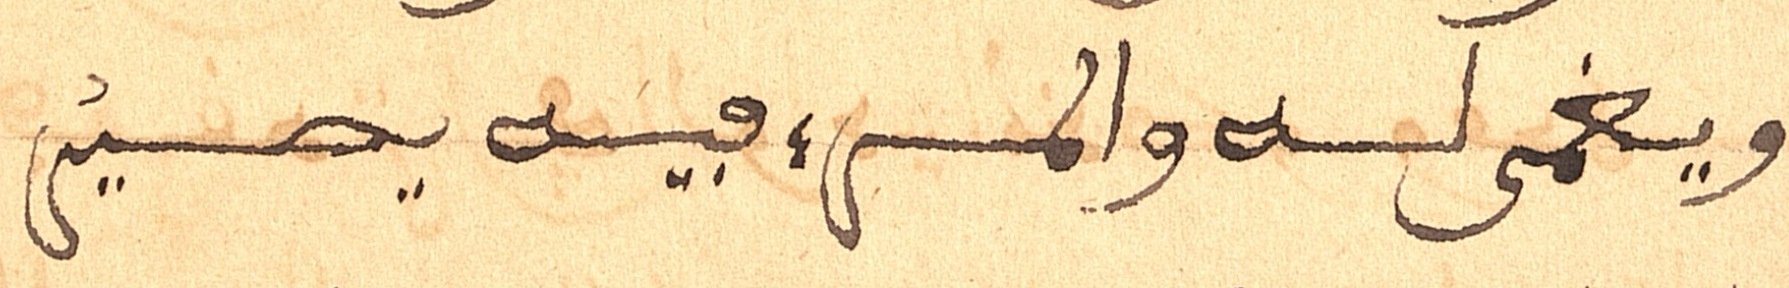ويغمى له والمرء فيه يصير
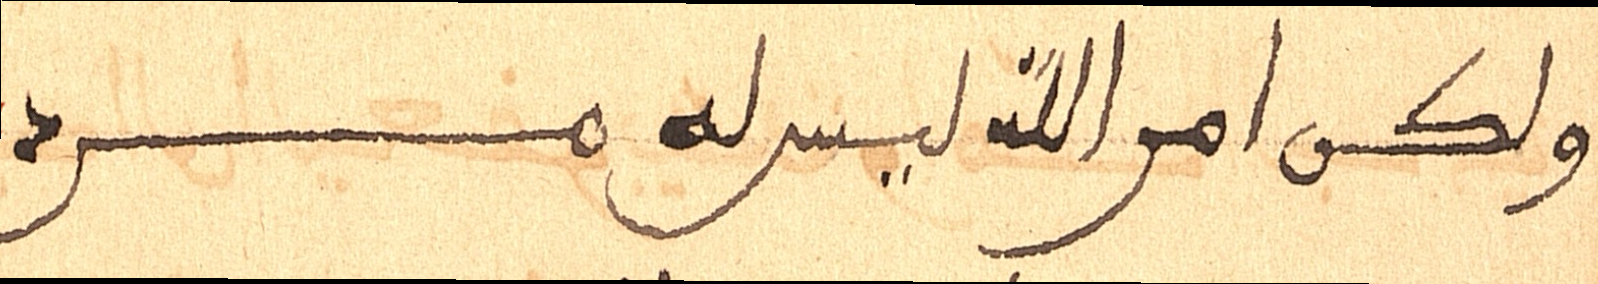ولكن امر الله ليس له مرد
